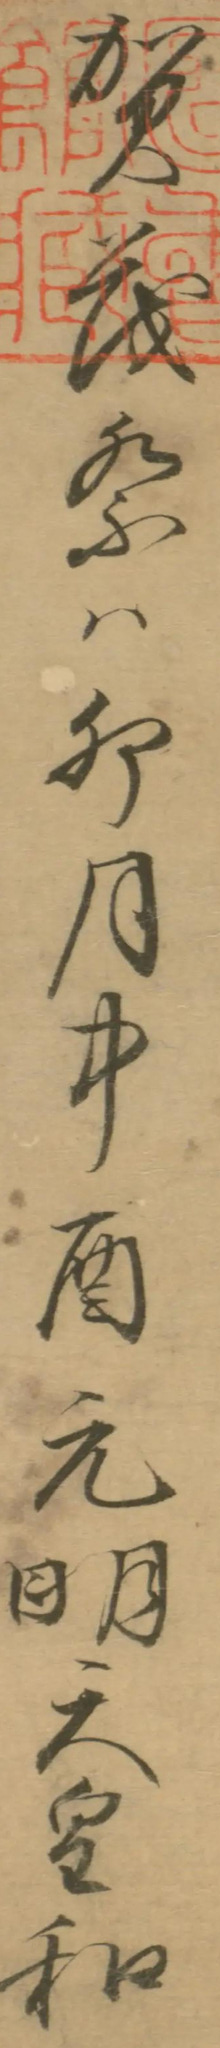賀茂祭は卯月中酉元明天皇和
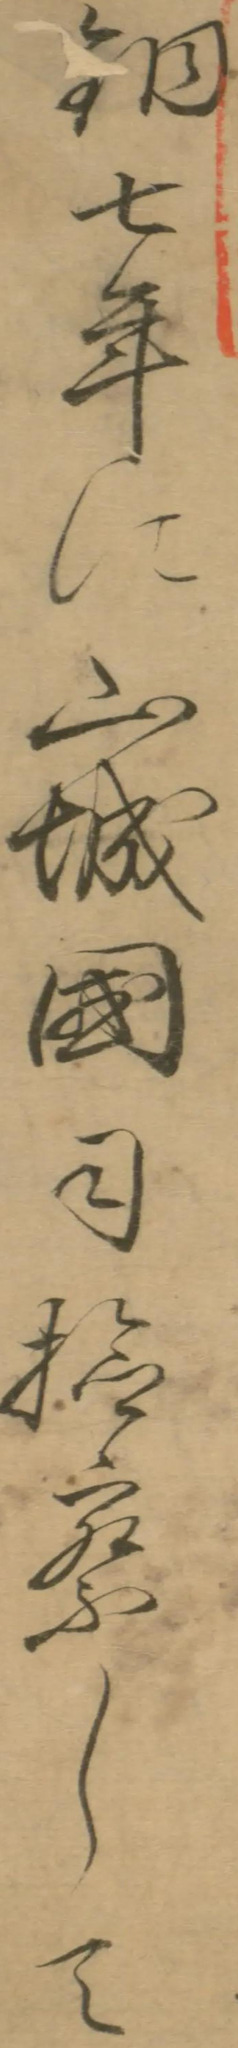銅七年に山城国司撿察して
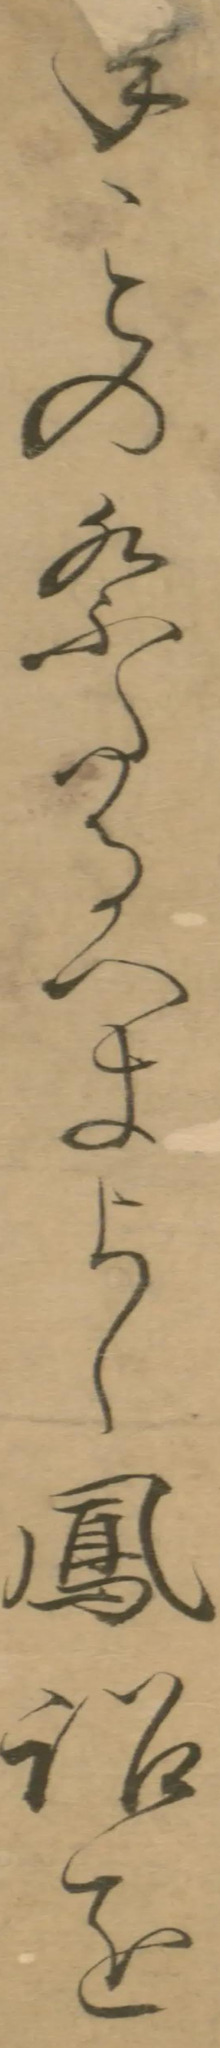年ことの祭たるへきよし鳳詔を
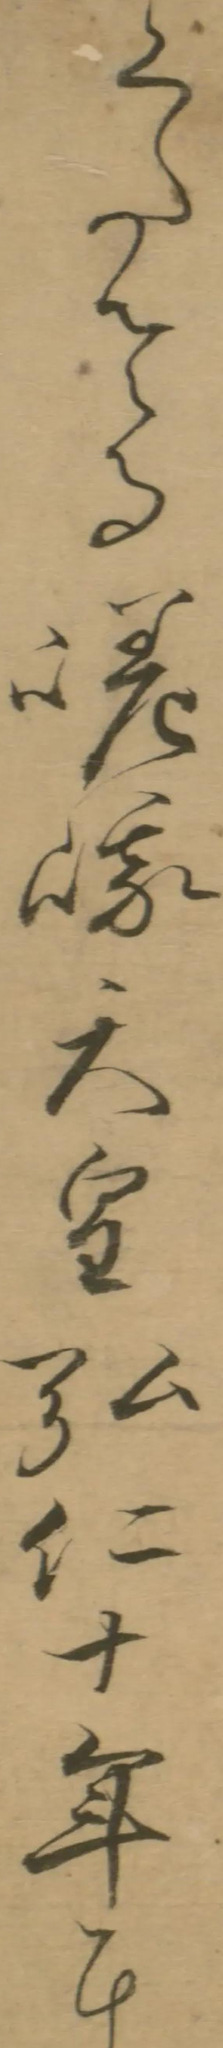くたさる嵯峨天皇弘仁十年に

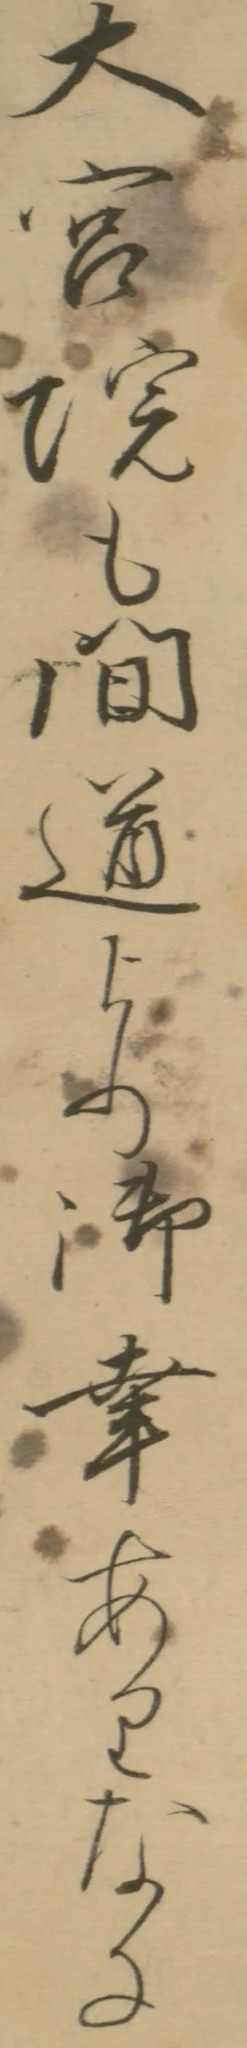大宮院も間道より御幸ありなに

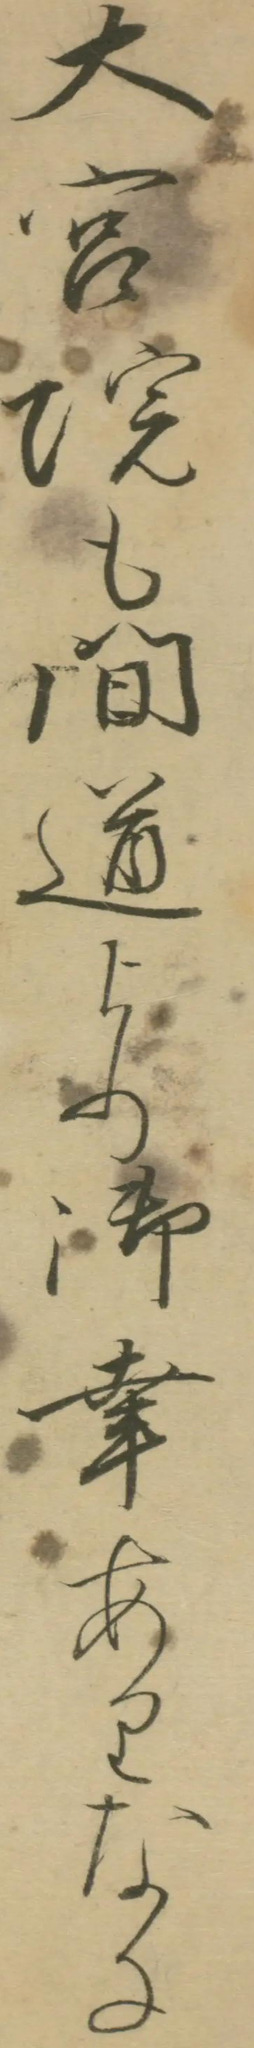大宮院も間道より御幸ありなに
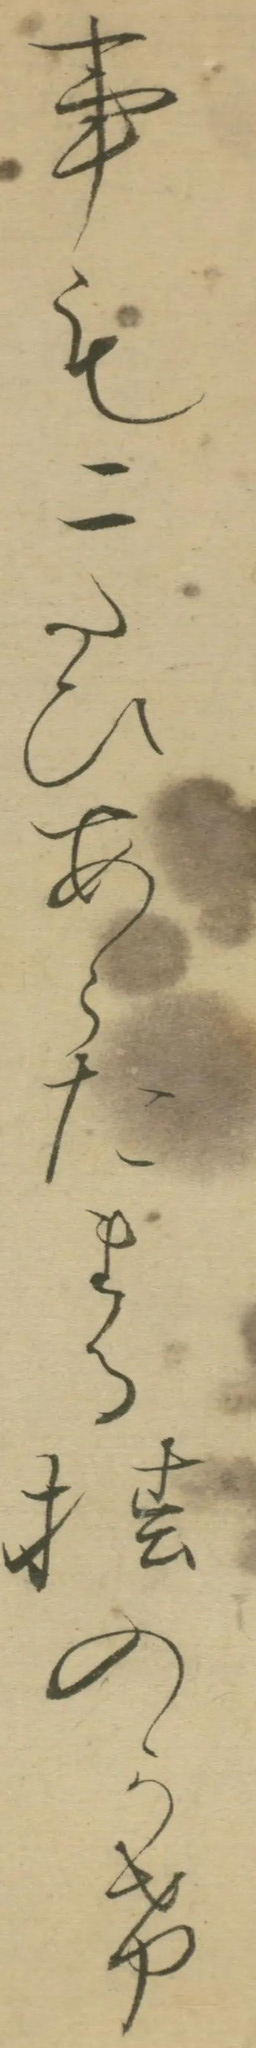事も二たひあらたまる椿のかけ
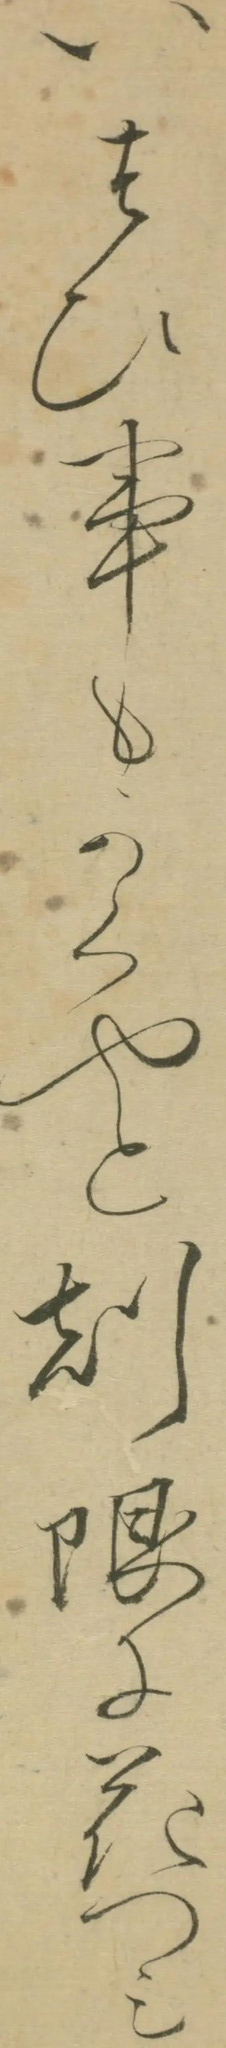いはひ事もかくやと刻限に花つみ
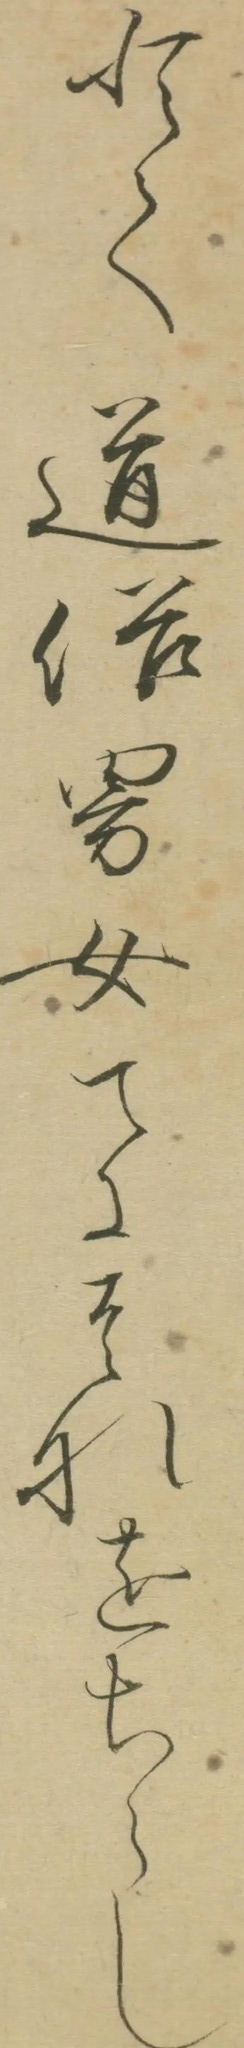とて道俗男女てにはなをちらし
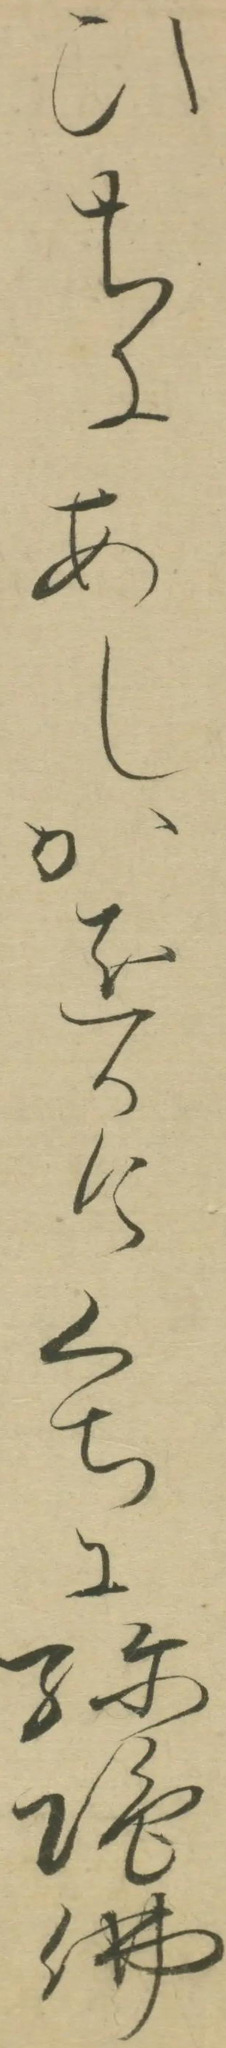ひちにあしかをかけくちに弥陀仏
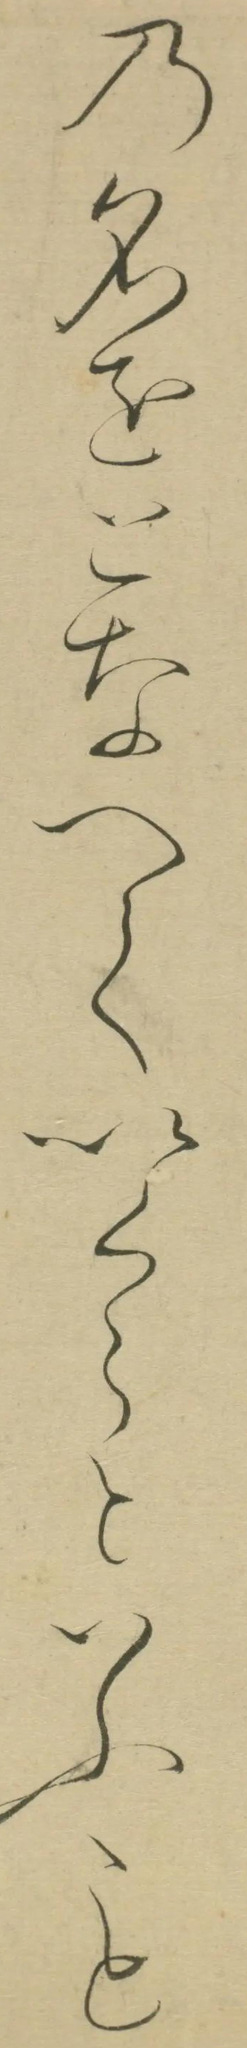の名をとなへていくらといふこと
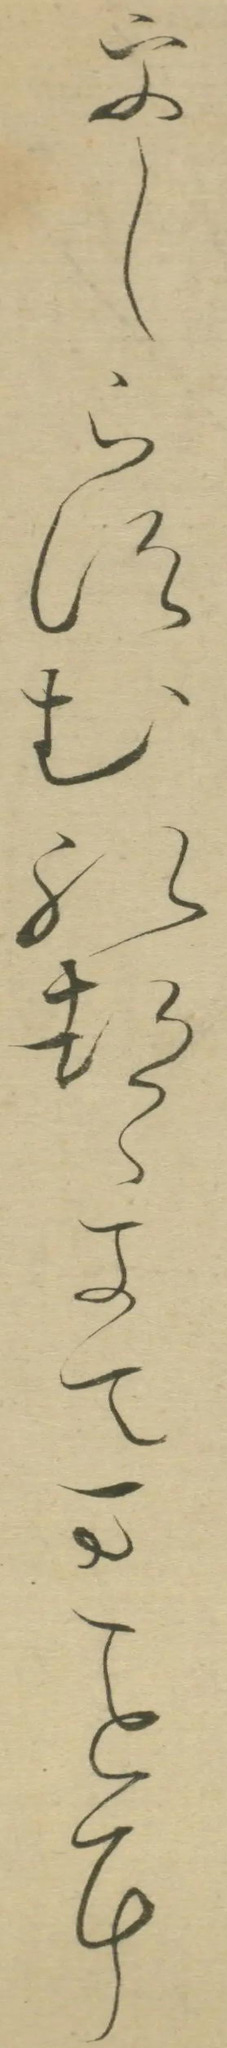をしらすむれつゝきてまことに
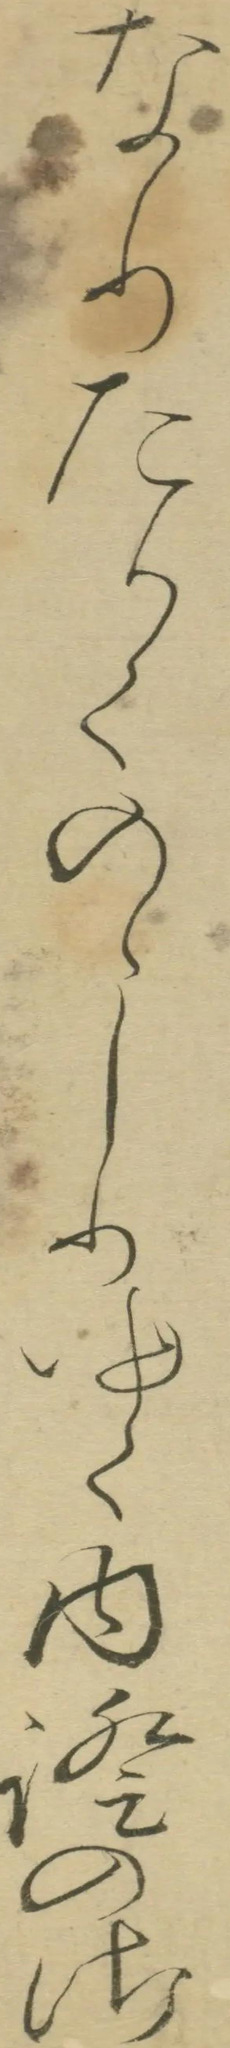なりたかくのゝしりゆく内證の御
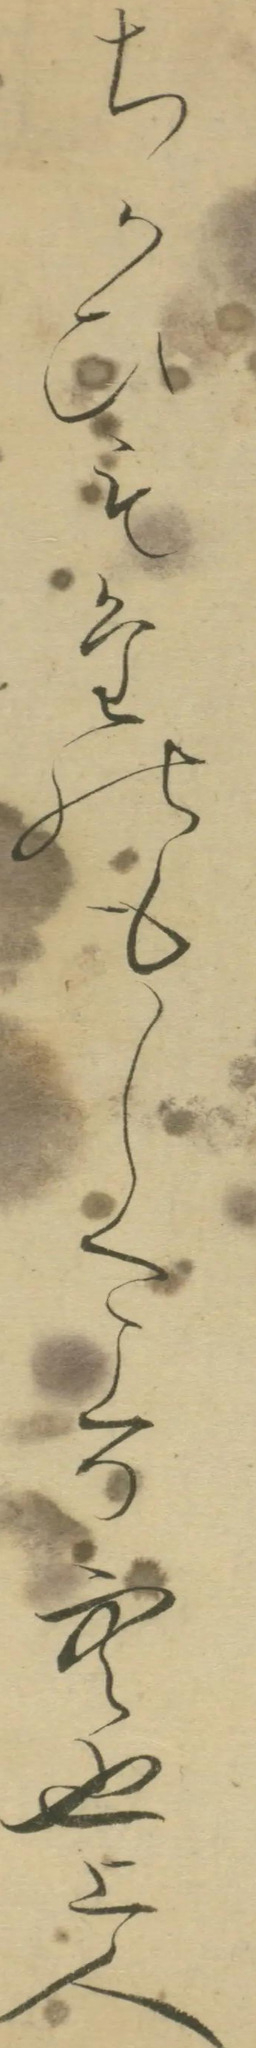ちかひもたのもしくこそ空也上人
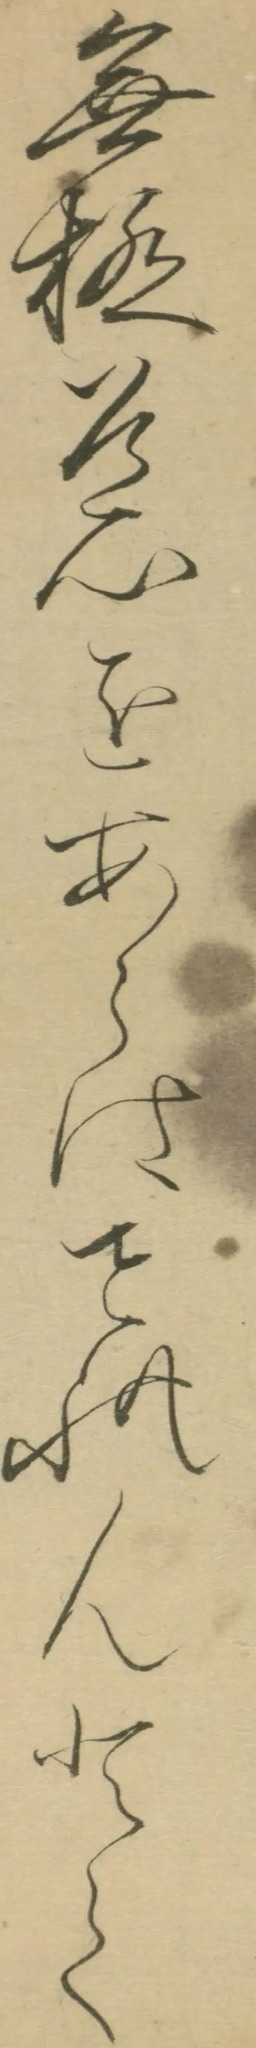無極道心をあらはされんとて
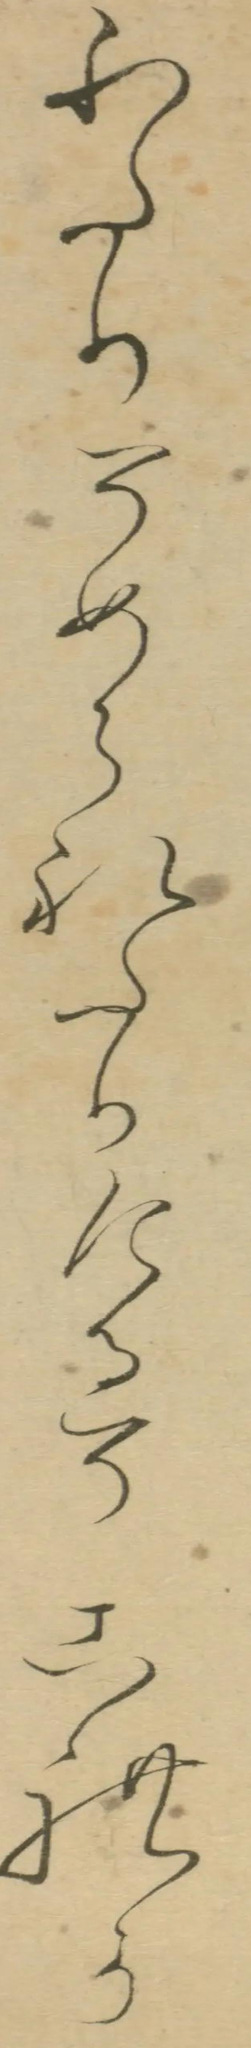わたりそめられたりけるそこれか
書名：文永賀茂祭図. [1]
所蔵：国立国会図書館 National Diet Library, JAPAN
